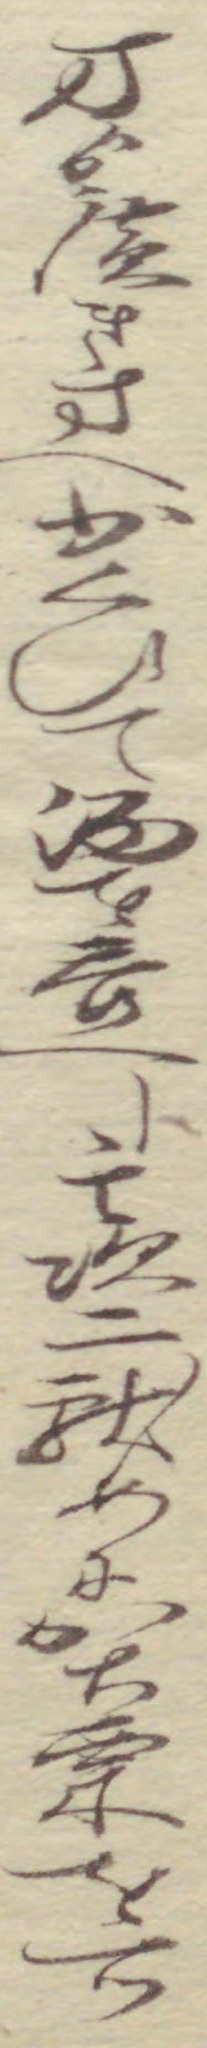方ゟ広き方へ少くひて酒を呑へし其次二献めにかち栗を一ツ
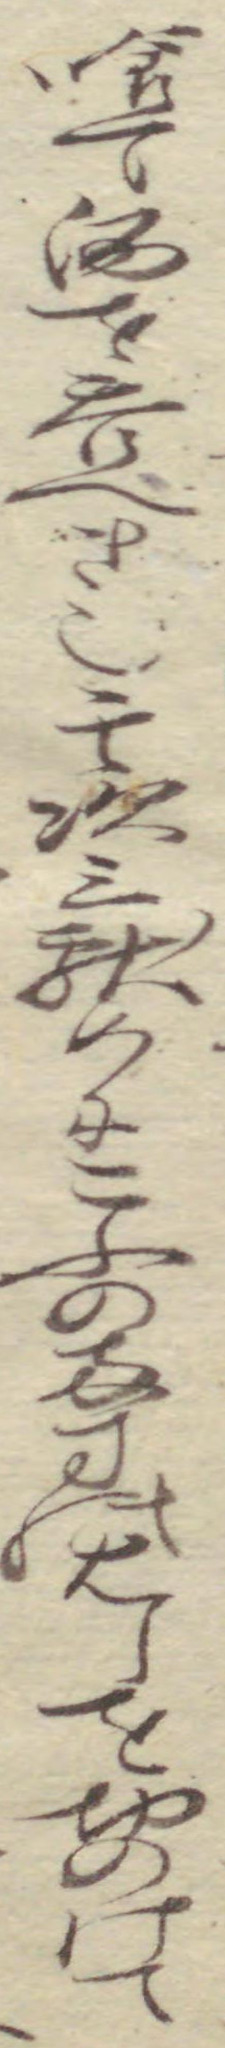喰て酒を呑へき也其次三献めにこふの両方のはしを切のけて
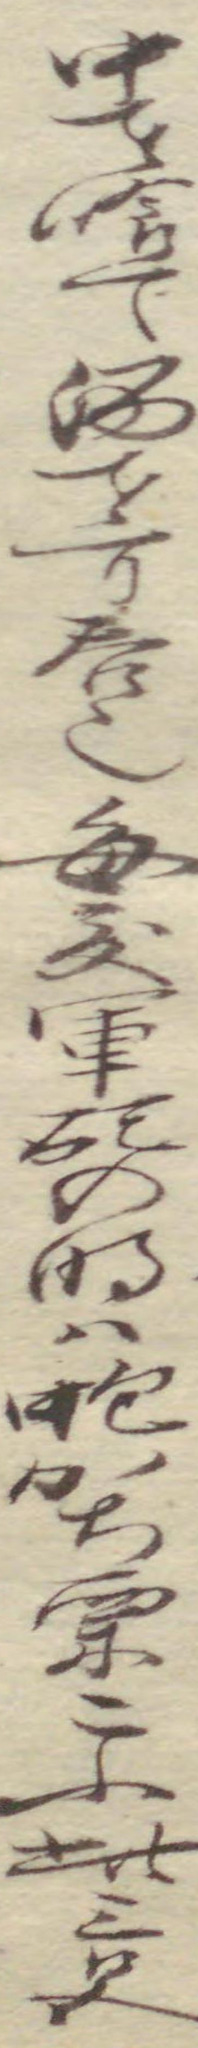中を喰て酒を可呑也毎度軍配の的ハ蚫かち栗こふ此三色
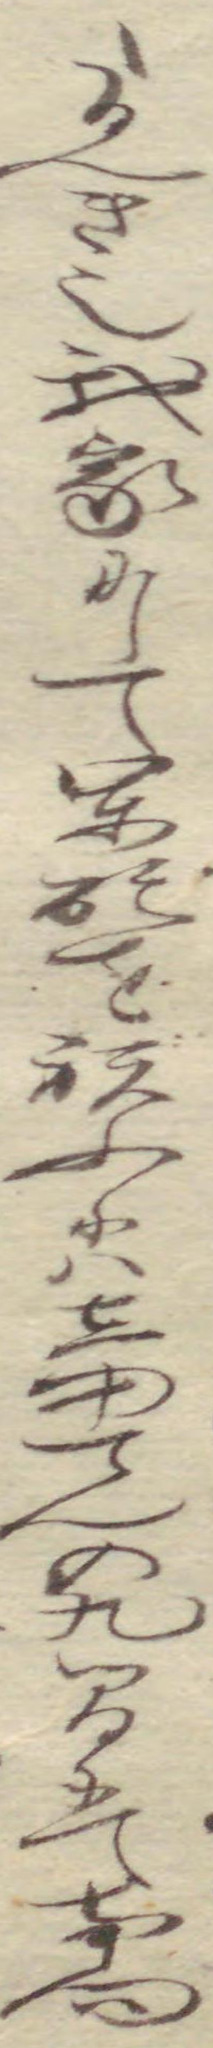たるへき也我家にして軍配を祝ふにハしゆてんの九間にて南向
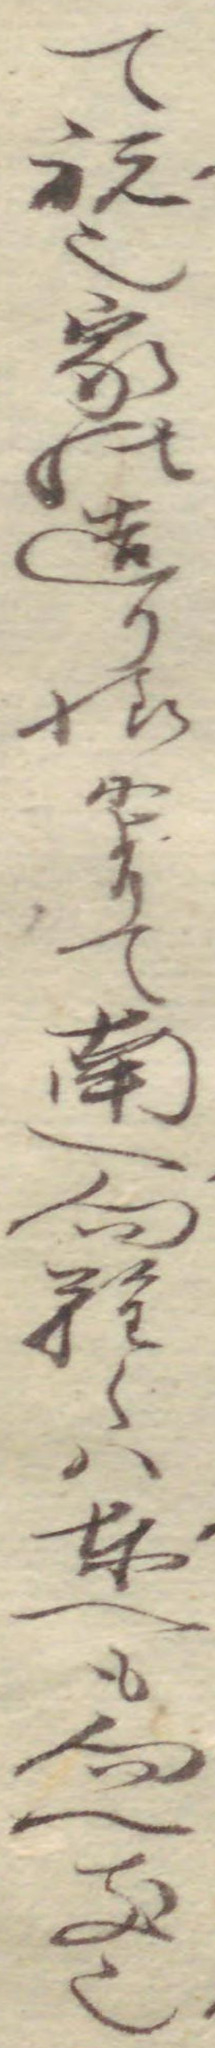て祝也家の造り様によりて南へ向難くハ東へも向へき也
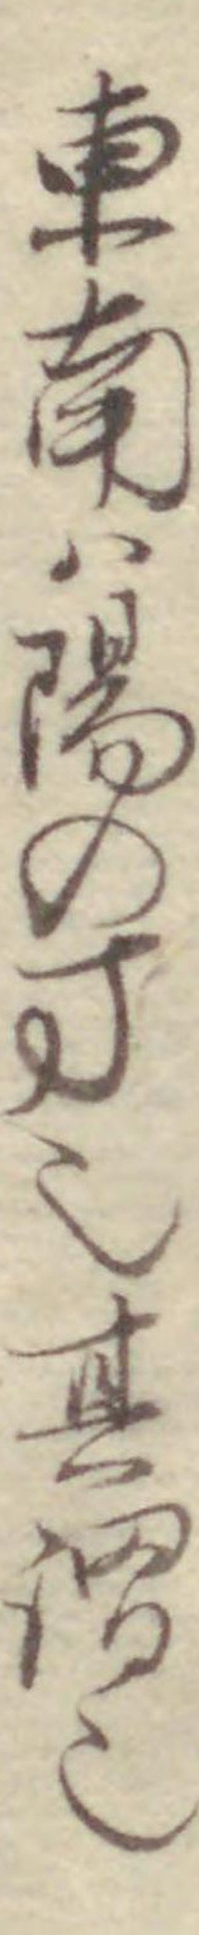東南ハ陽の方也其謂也
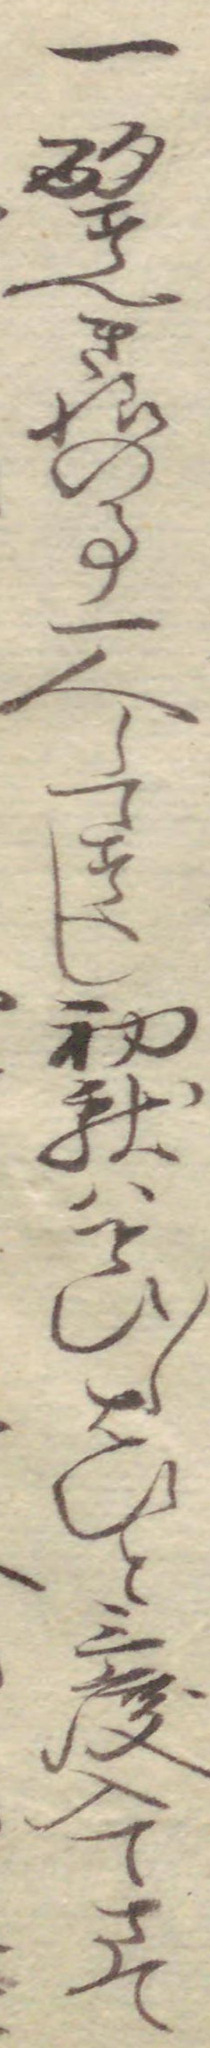一酌すへき様の事一人してすへし初献ハそひ〳〵はひと三度入てさて
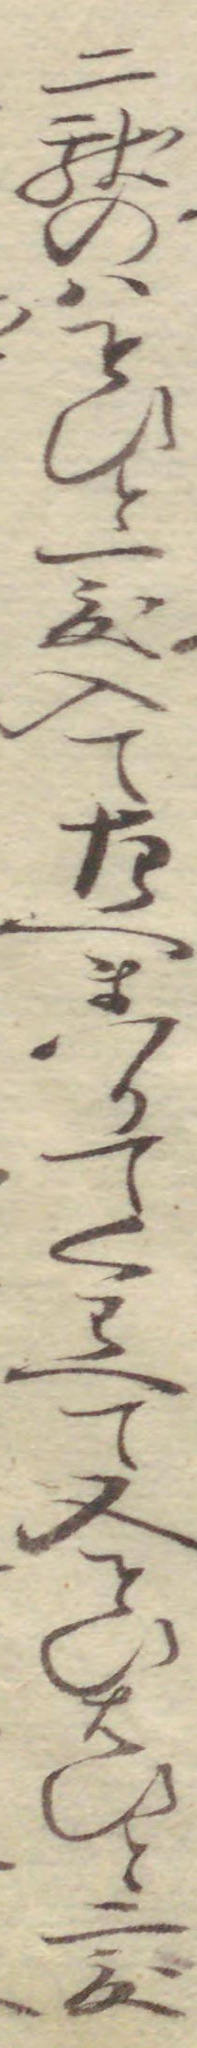二献のハそひと一度入て左へまハりてくわへて又そひはひと二度
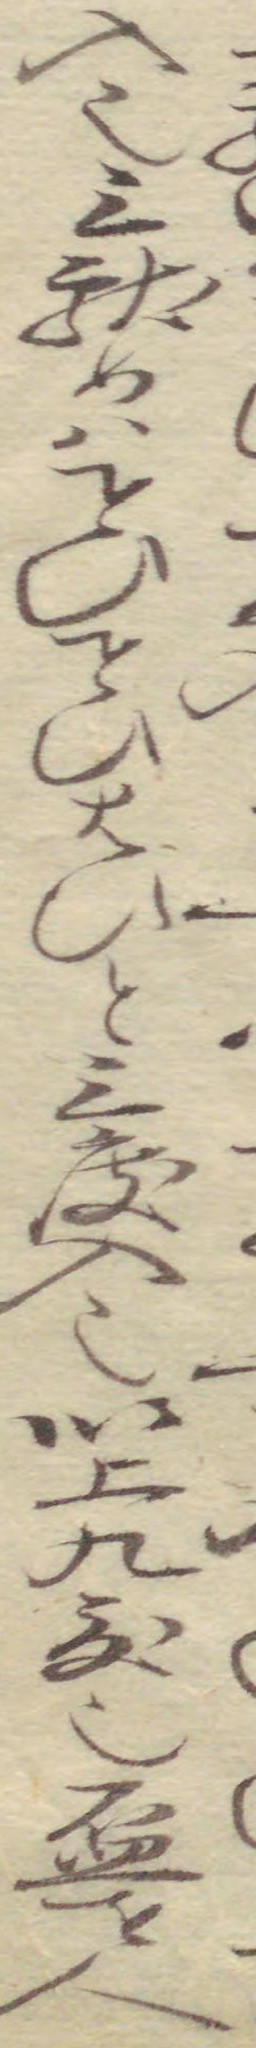入也三献めハそひそひはひと三度入る也以上九度也盃を人
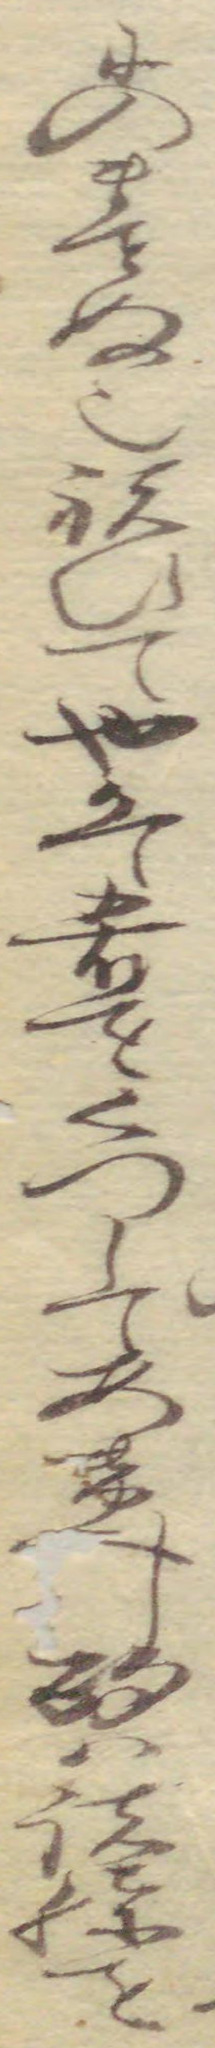にのませぬ也祝ひてやかて肴をくつしてあけへし酌ハ諸膝を

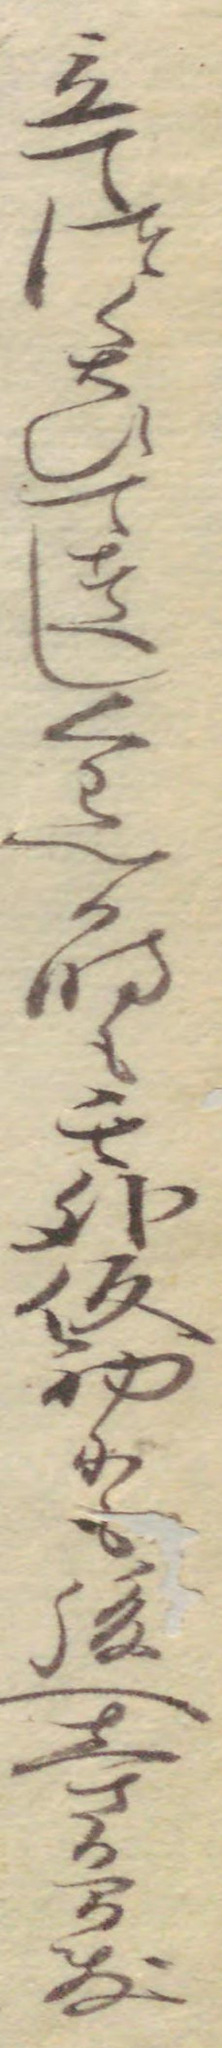立てつくはひてすへしくわへる時も其外仮初にも後へしさる間敷
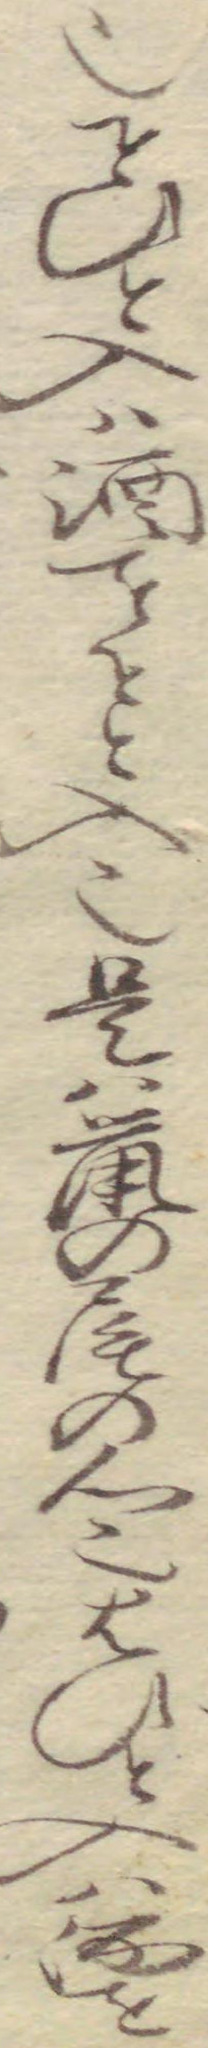也そひと入ハ酒をそと入也是ハ鼠の尾の心也はひと入ハ酒を
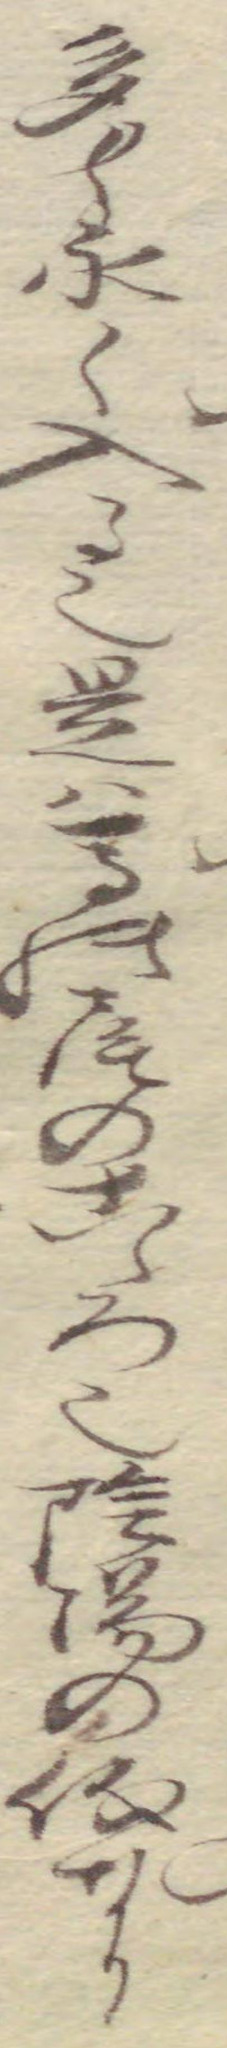多く永く入る也是ハ馬の尾のこゝろ也陰陽の儀なり
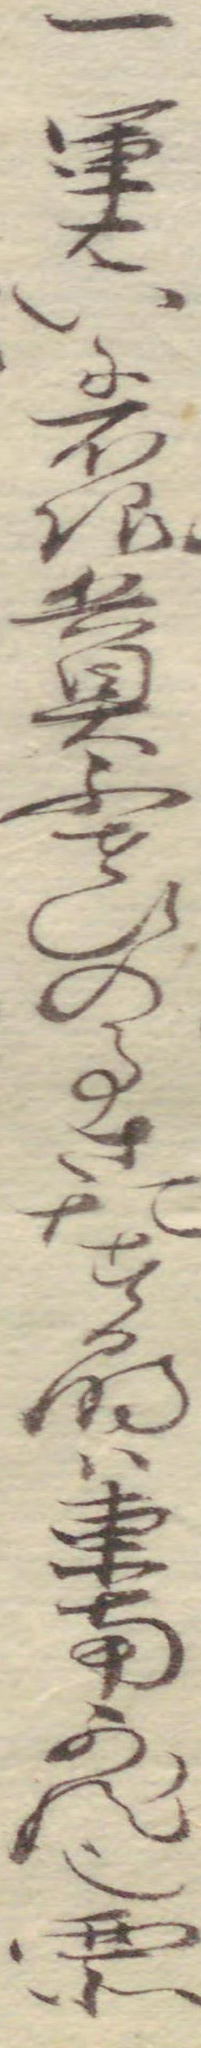一軍はいに不限兵具ふせひの事さたする時ハ東南可然也西北
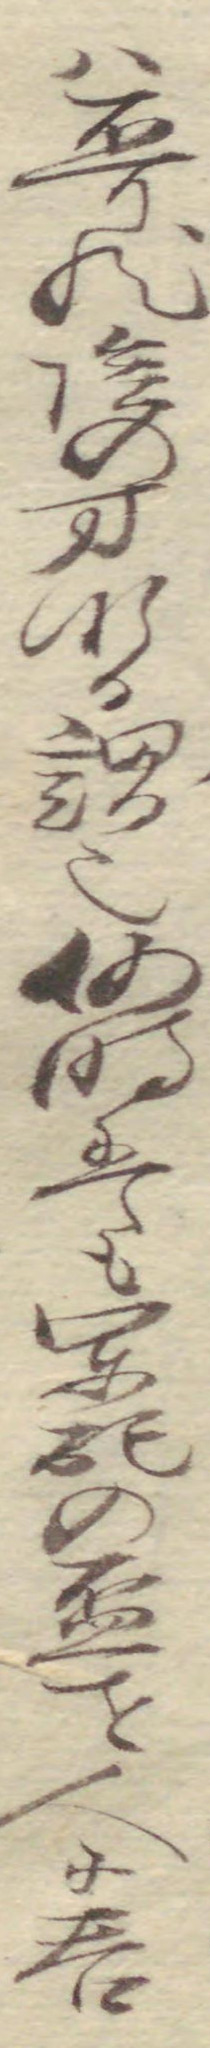ハ不可然陰の方なる謂也何時にても軍配の盃を人に呑
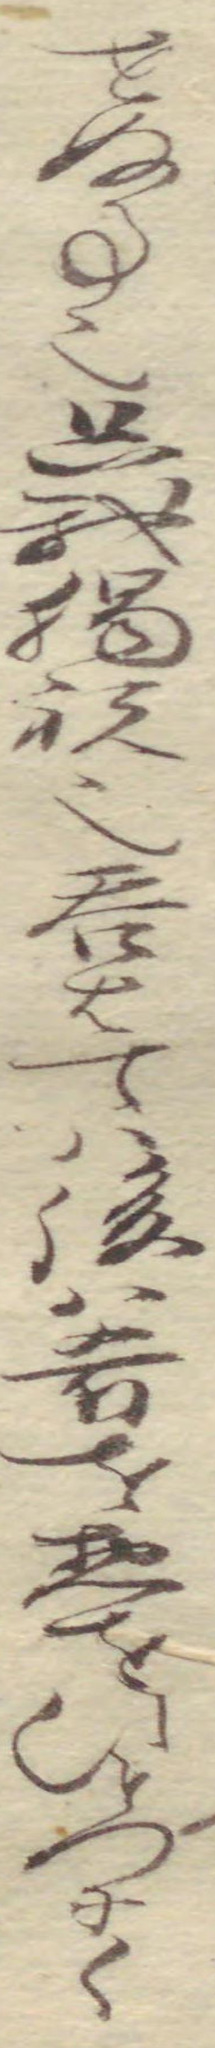せぬ事也只我獨祝也呑はてハ後は肴を惣をひとつにく
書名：鶯宿雑記. 巻199-200
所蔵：国立国会図書館 National Diet Library, JAPAN
